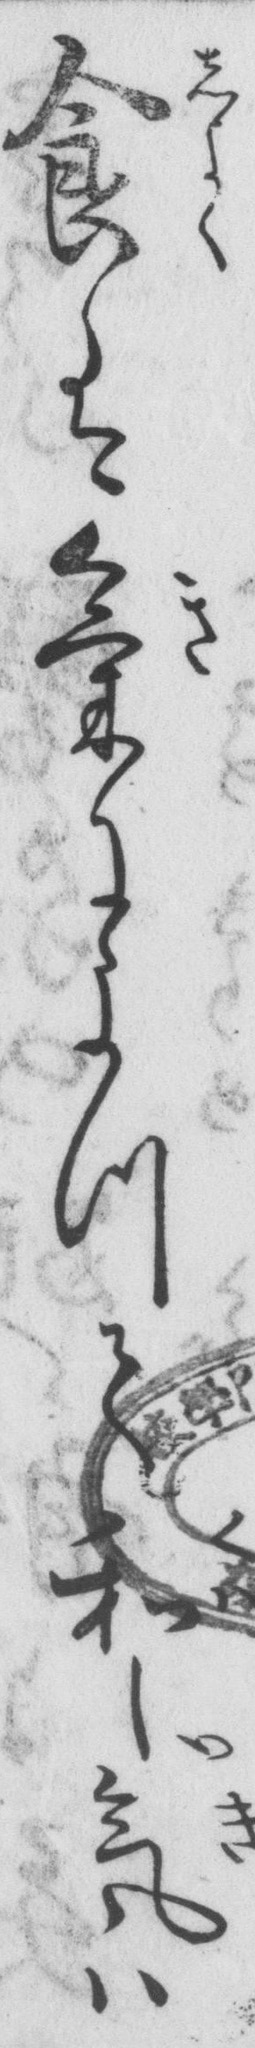食は気によつて和し。気は
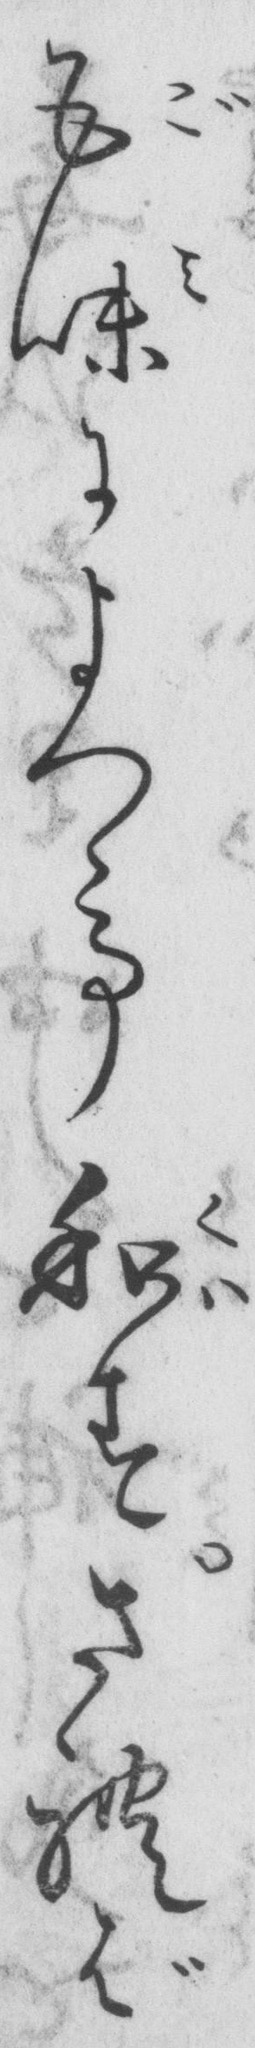五味によつて和す。されば
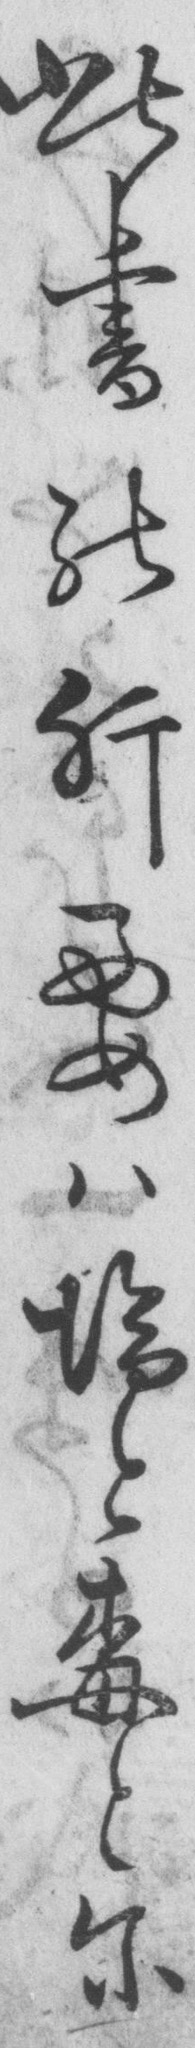此書の肝要は。塩と梅とに

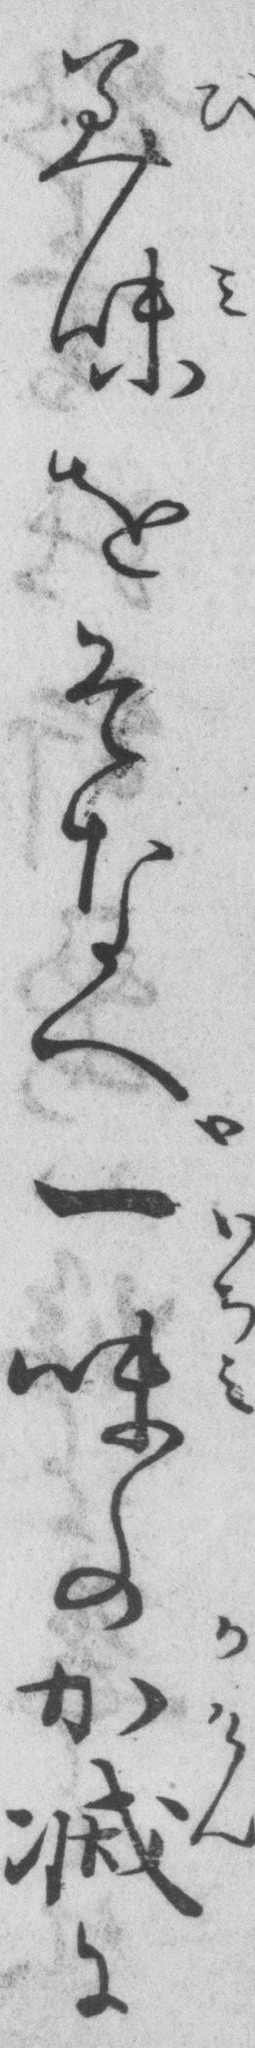美味をそなへ。一味の加減に
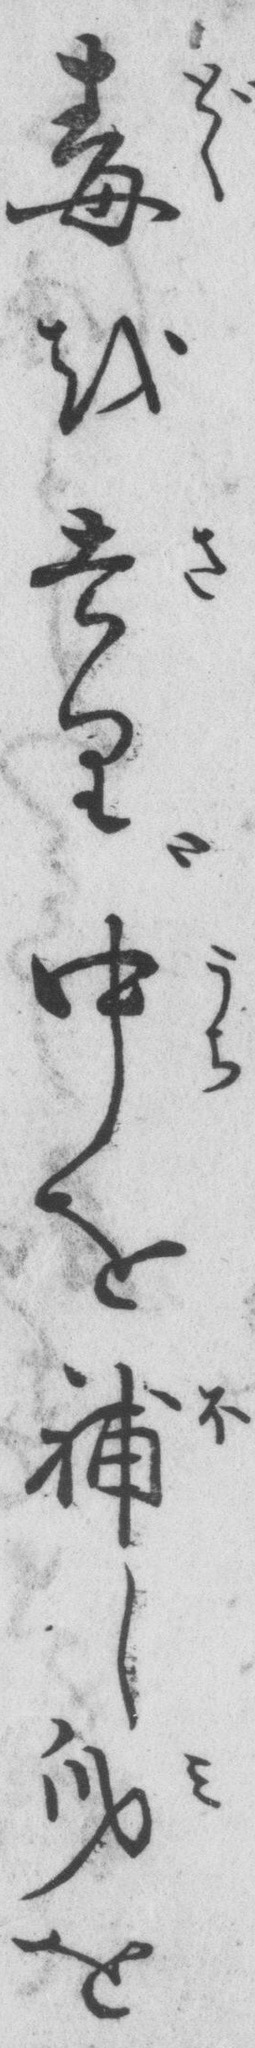毒を去り。中を補し身を
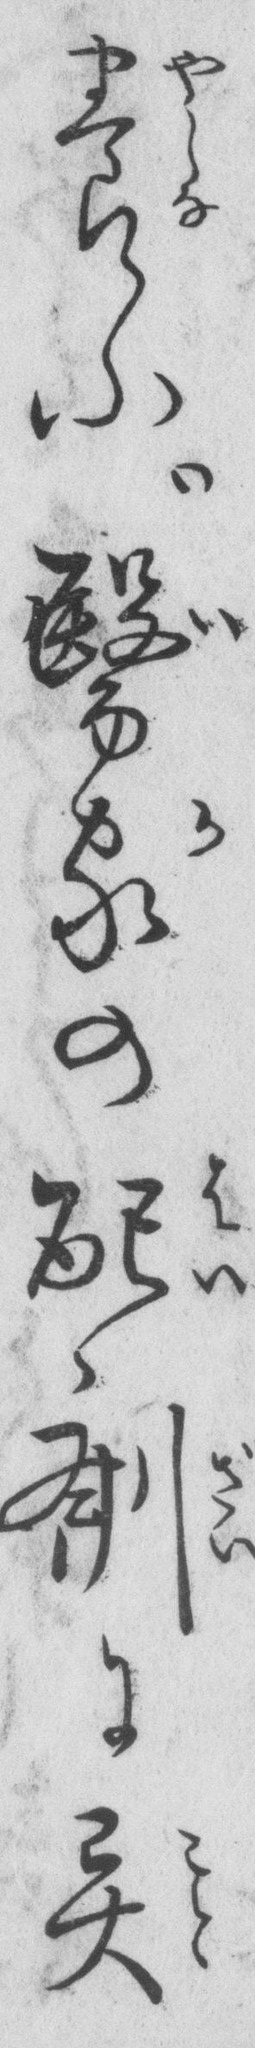養ふ。医家の配剤に異
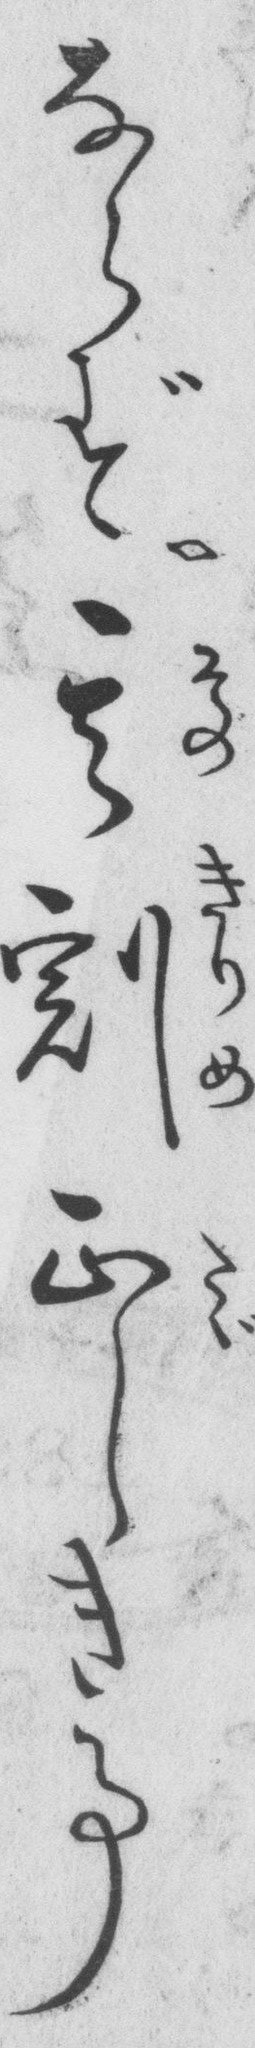ならず。其割正しき事
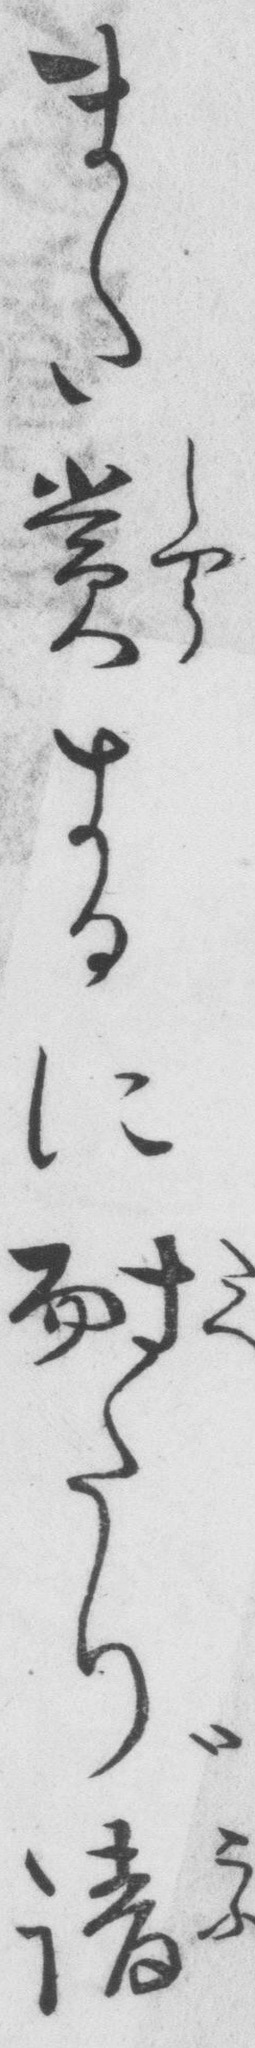また賞するに耐たり。請
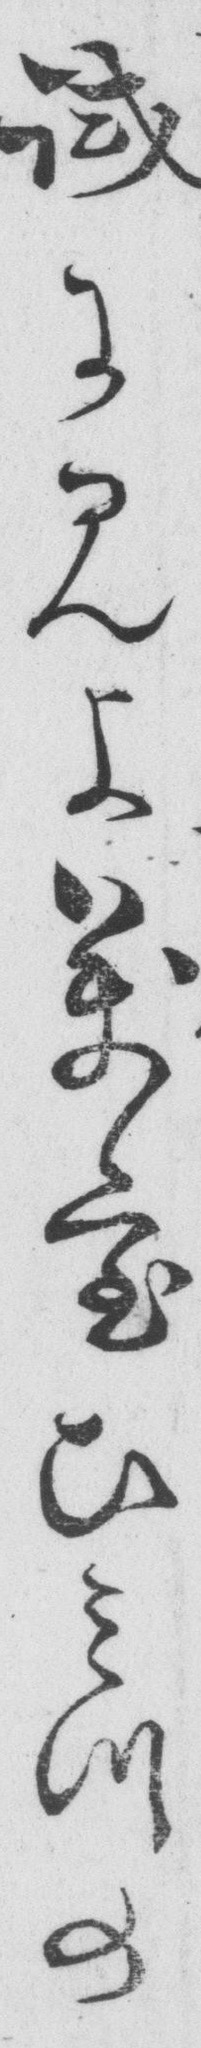試みに見よ。万宝ひみつの
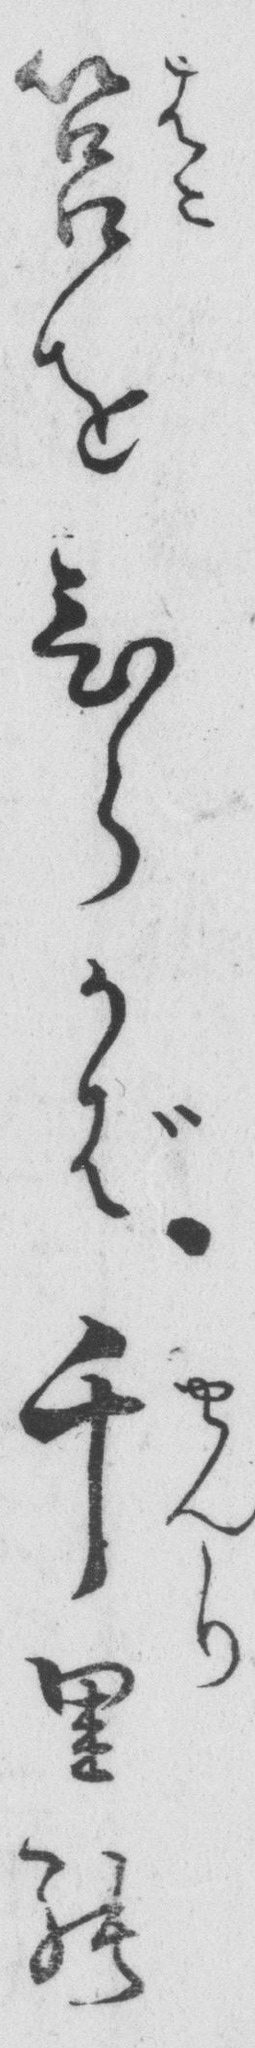筥をひらかば。千里の
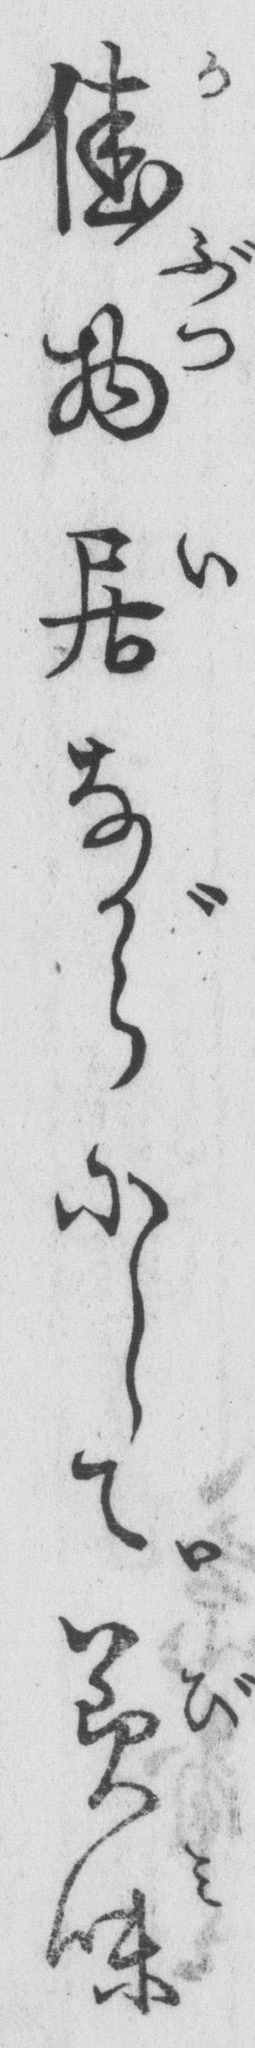佳物居ながらにして。美味
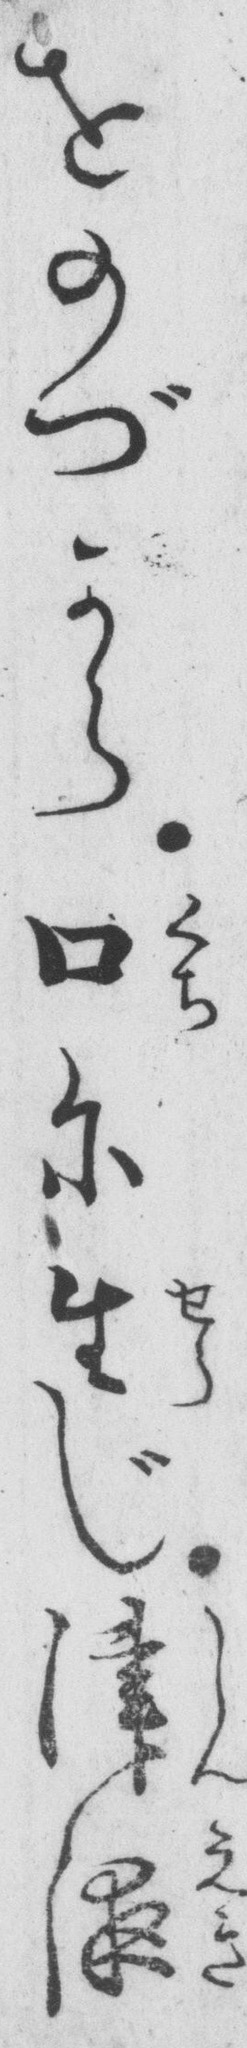をのづから。口に生じ。津液
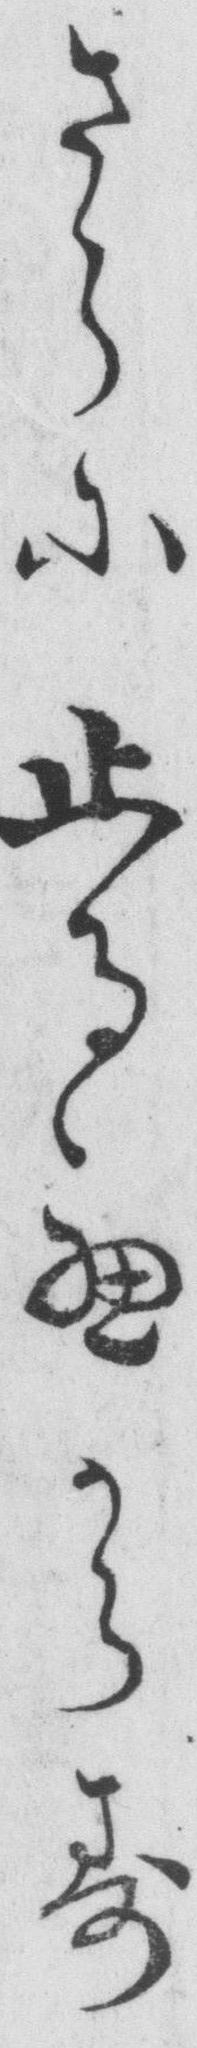さらに止るべからず

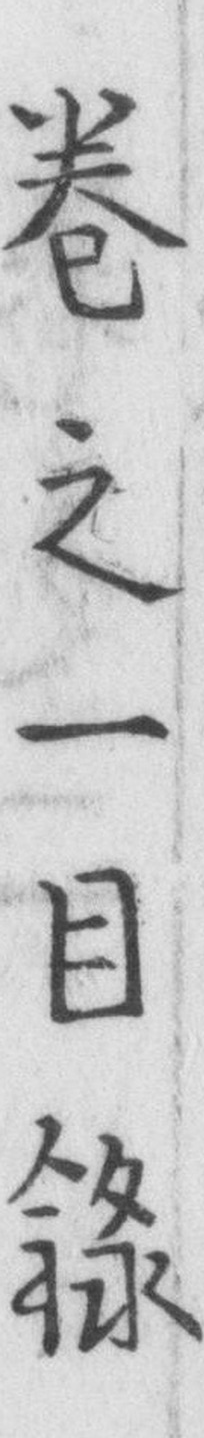巻之一目録
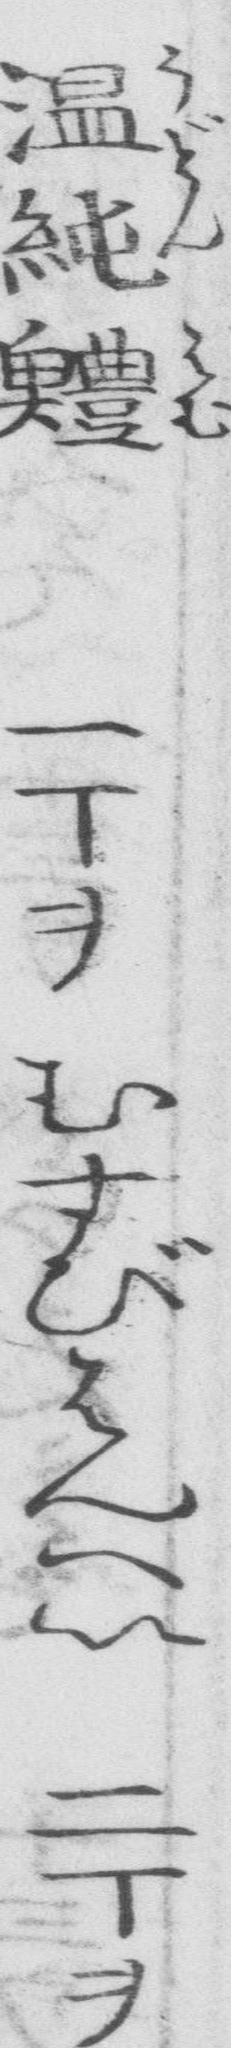饂飩鱧一丁ヲむすびはんへい二丁ヲ
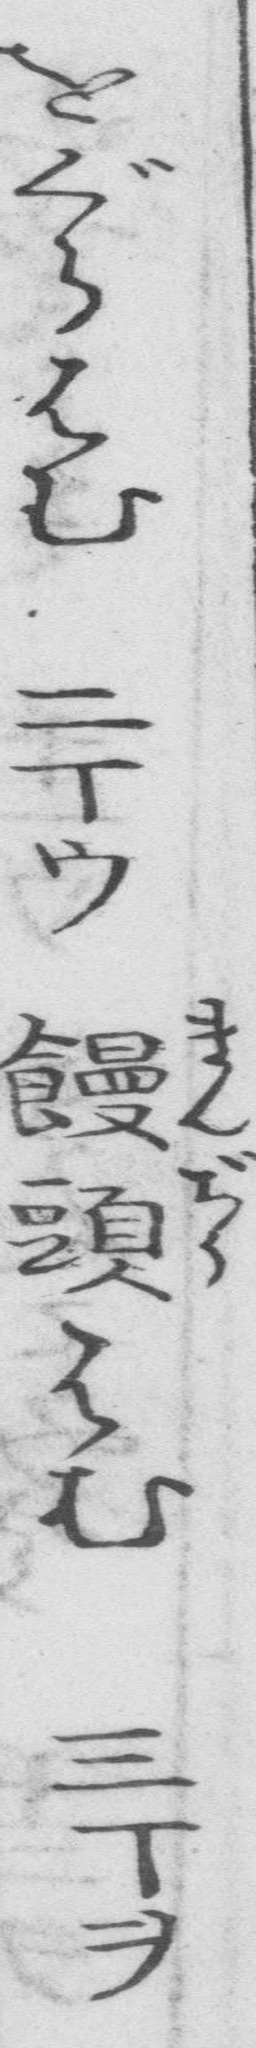をぐらはむ二丁ウ饅頭はむ三丁ヲ
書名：萬寳料理秘密箱
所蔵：大阪府立大学学術情報センター 国文学研究資料館
